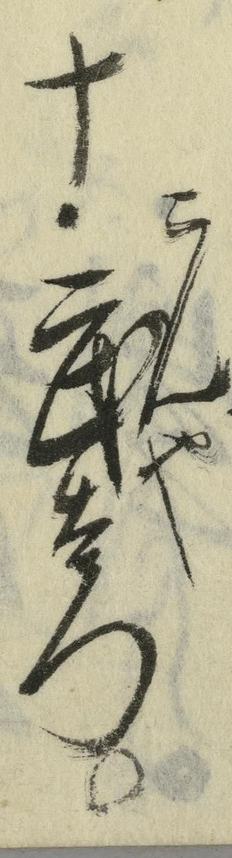十武右衛門

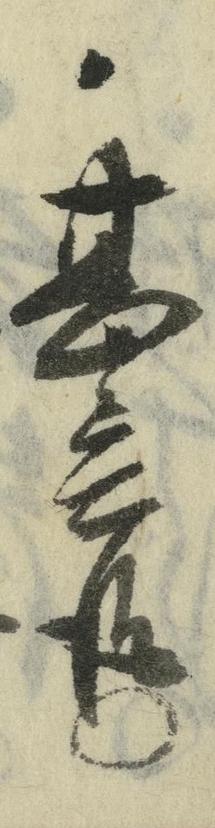甚兵衛
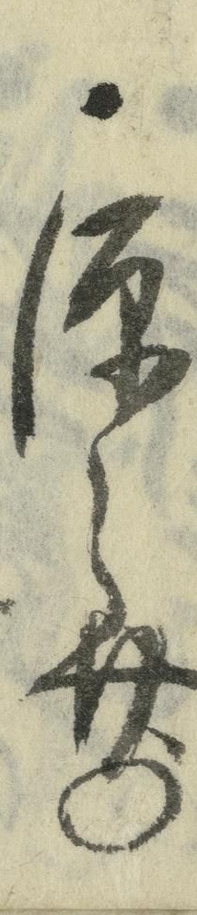甚兵衛
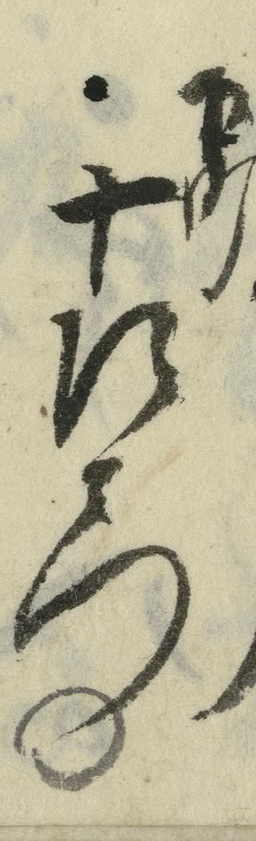十左衛門
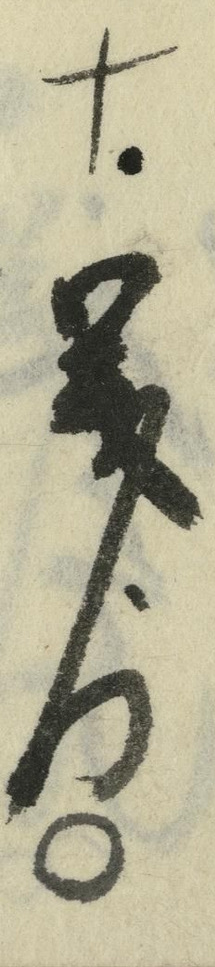十義右衛門
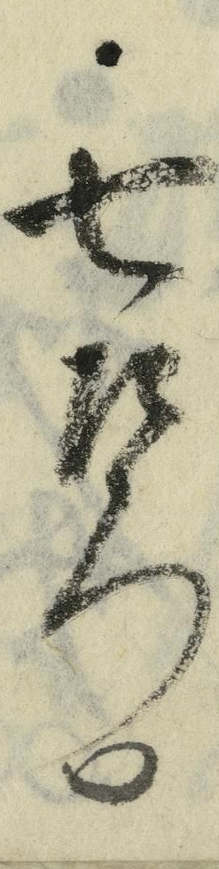七左衛門
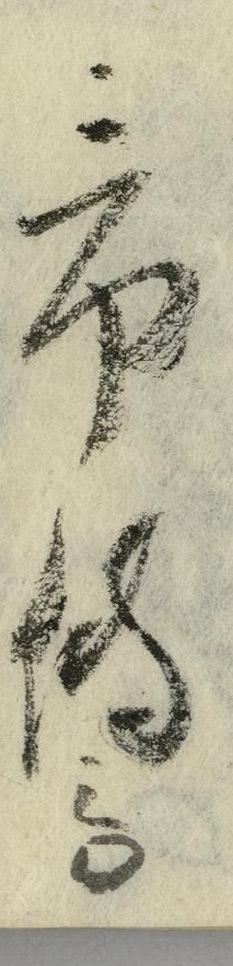市伝三
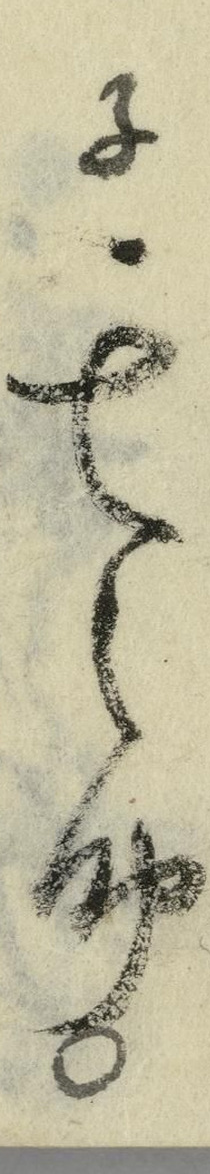子七之助
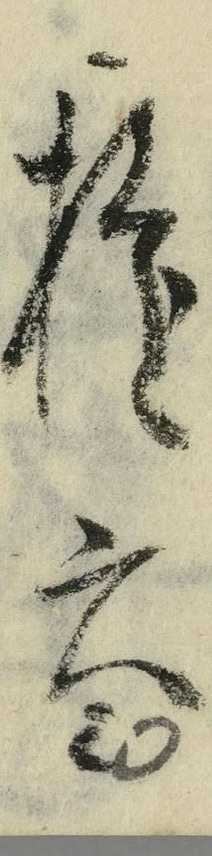権六三
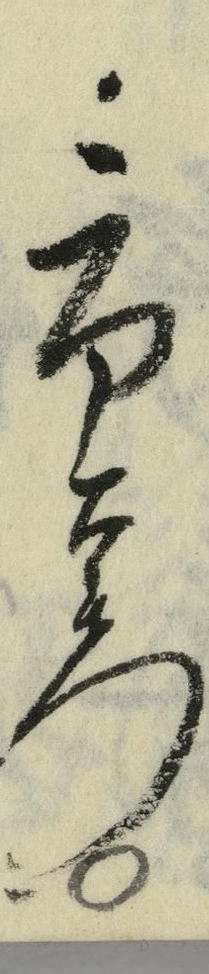十義右衛門

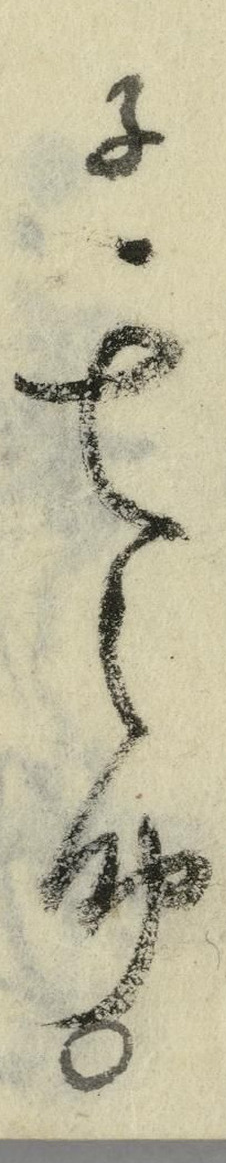子万之助
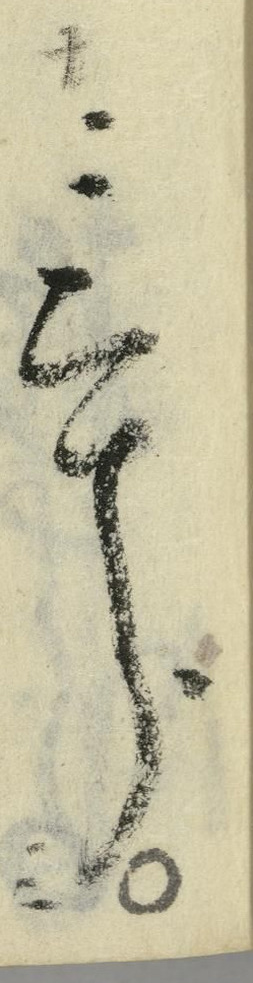三十郎
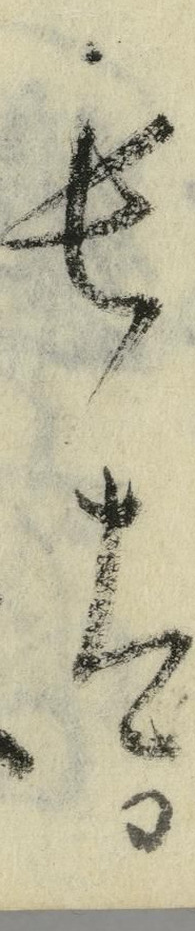三十郎
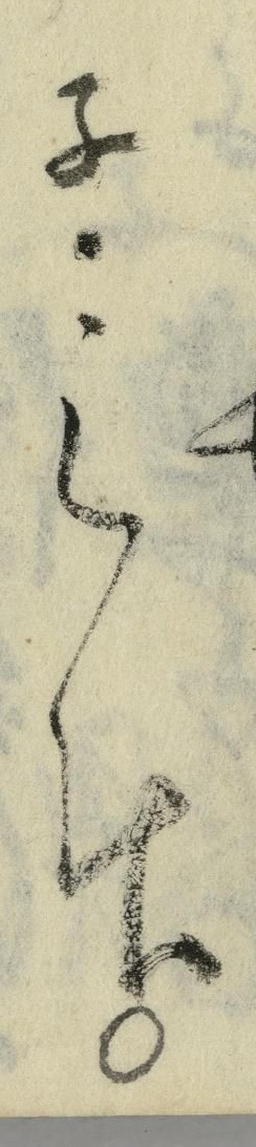子三次
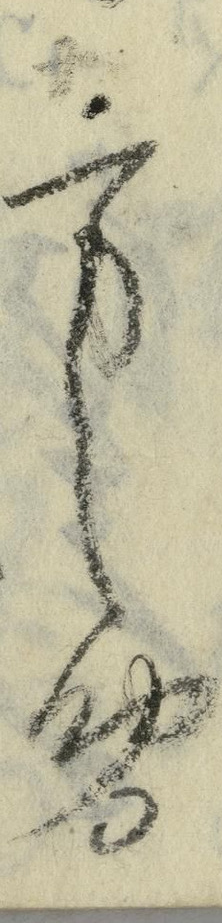麻之助
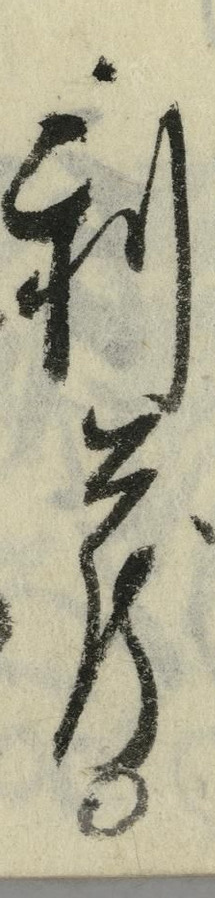庄兵衛
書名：天明淺間噴火ニ関スル書類
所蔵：東京大学地震研究所図書室 Earthquake Research Institute Library, The University of Tokyo, JAPAN
